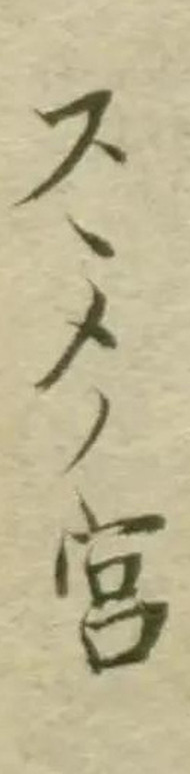スヽメノ宮
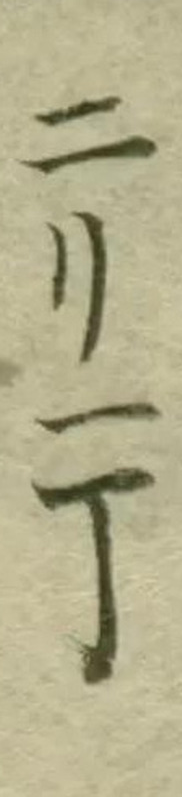二リ一丁
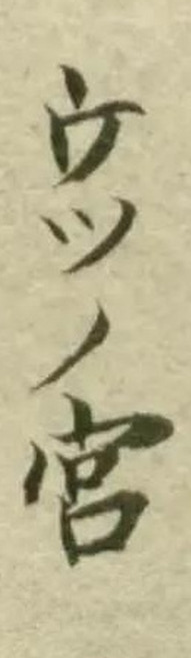ウツノ宮

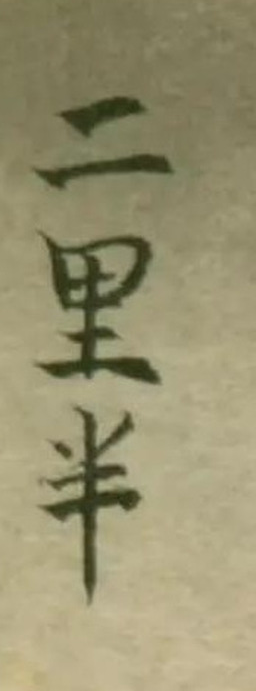二里半
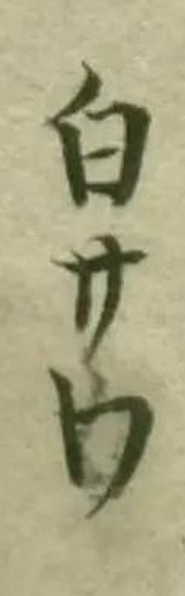白サワ
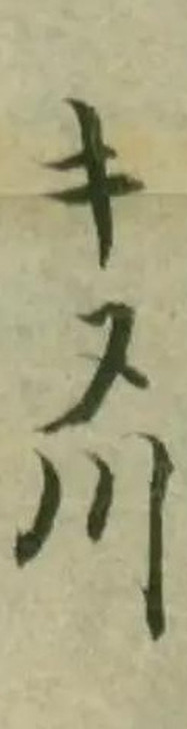キヌ川
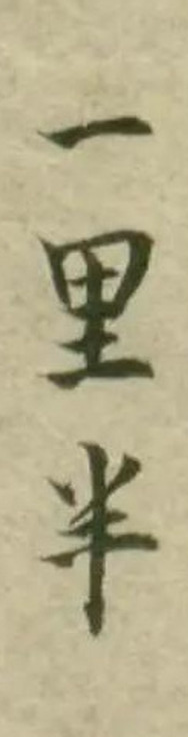一里半

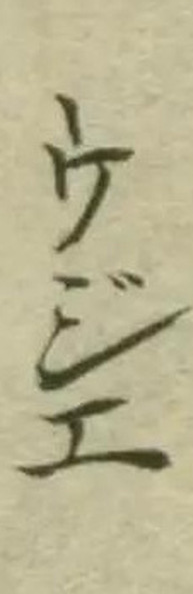ウジエ

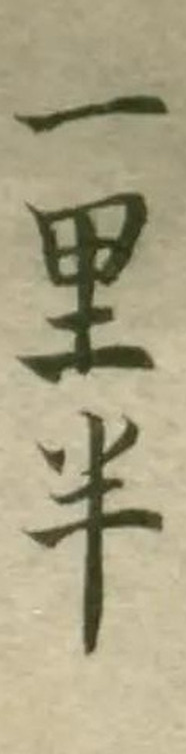一里半

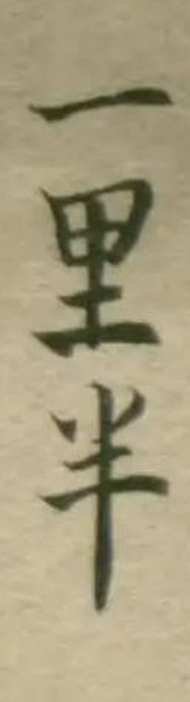一里半
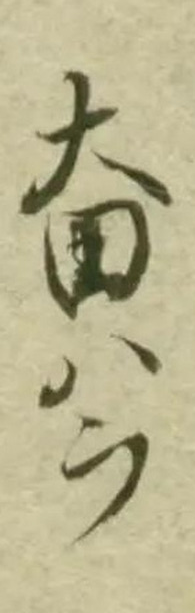大田ハラ
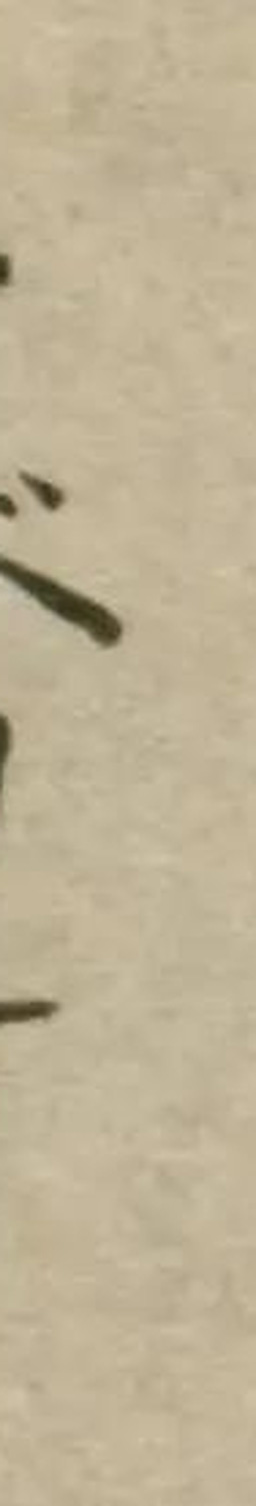ナベカケ

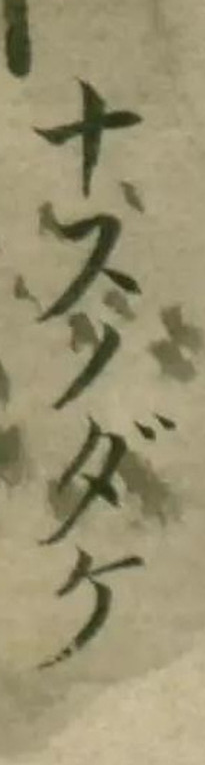ナスノダケ
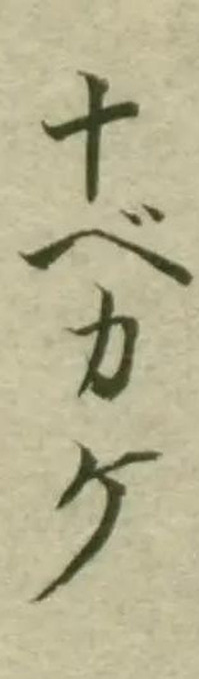ナベカケ
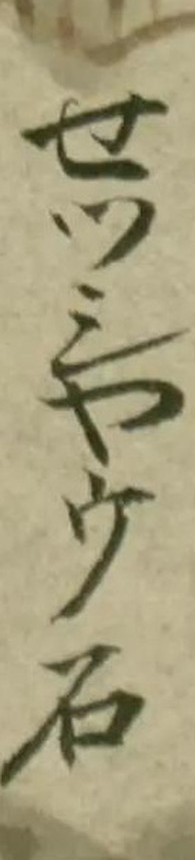セツシヤウ石
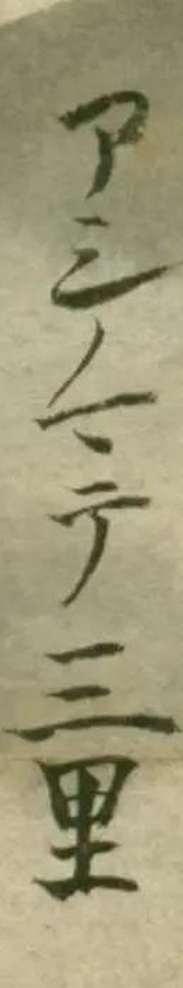アシノマテ三里
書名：江戸より奥州津輕迄道筋之圖
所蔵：国立国会図書館 National Diet Library, JAPAN
